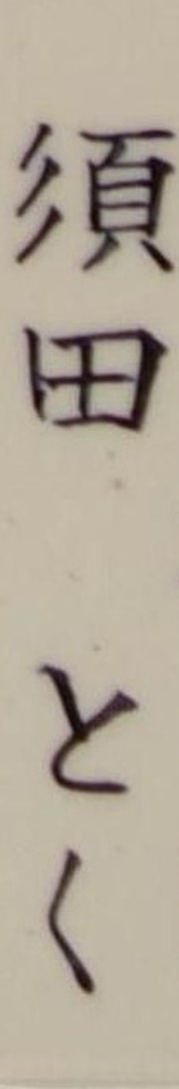須田とく
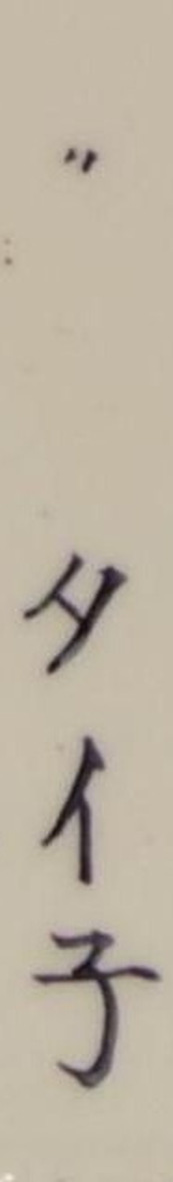タイ子
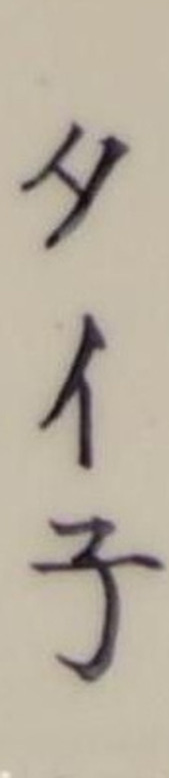タイ子
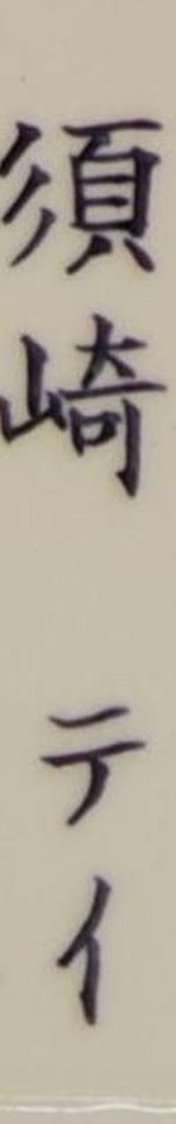須崎テイ
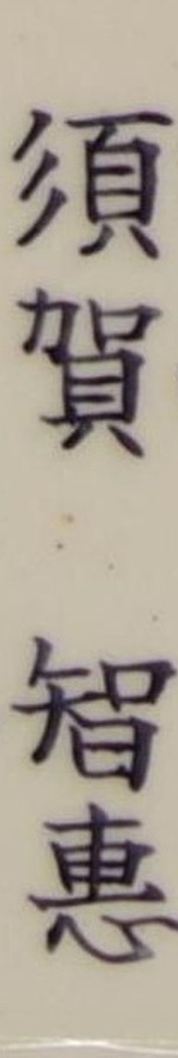須賀智恵

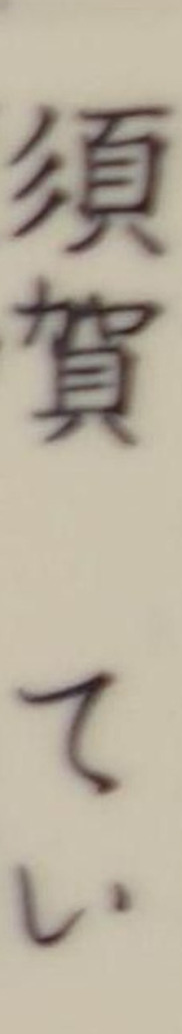須賀てい
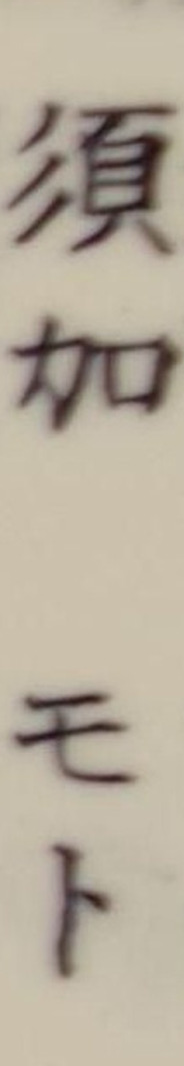須加モト
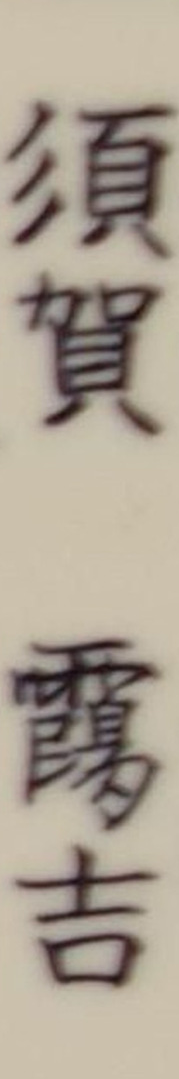須賀靏吉
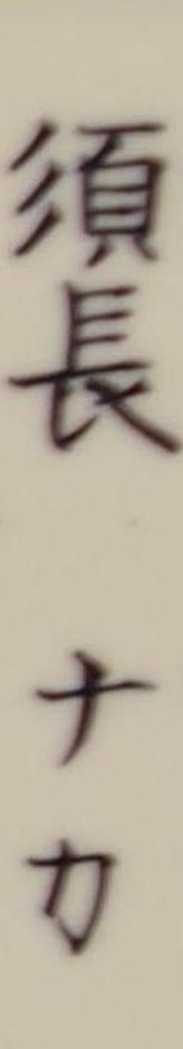須長ナカ
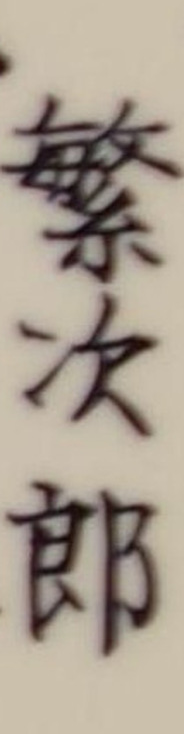繁次郎
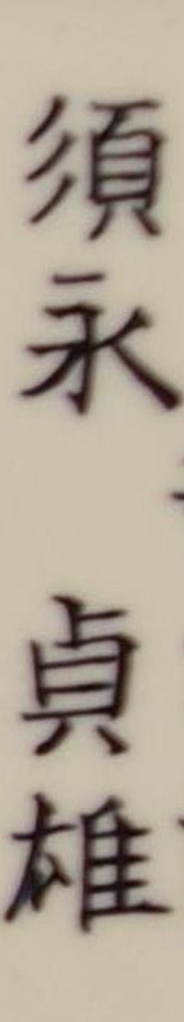須永貞雄
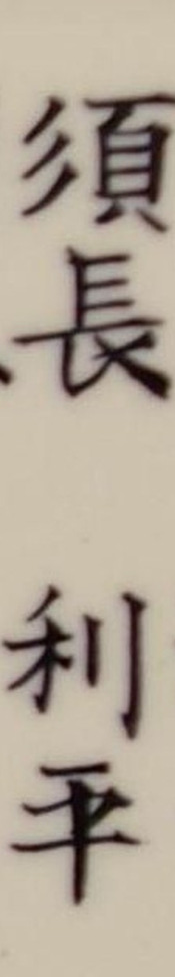須長利平
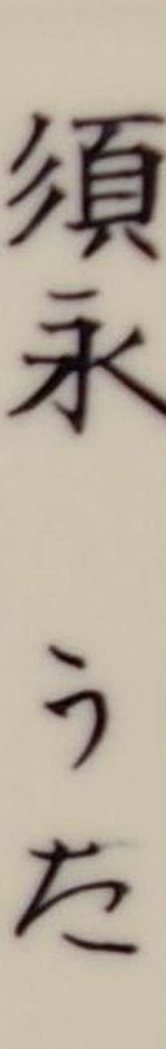須永うた
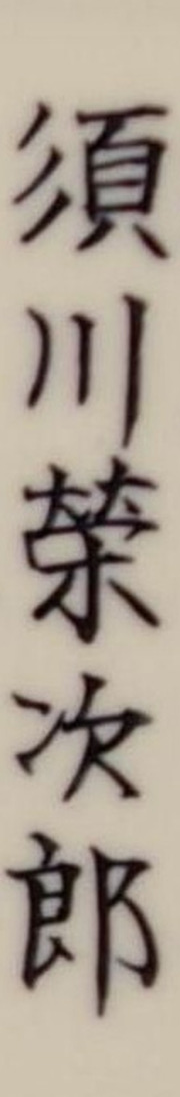須川榮次郎
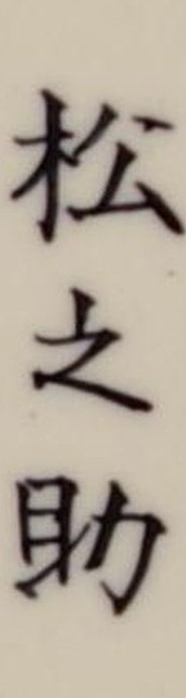松之助
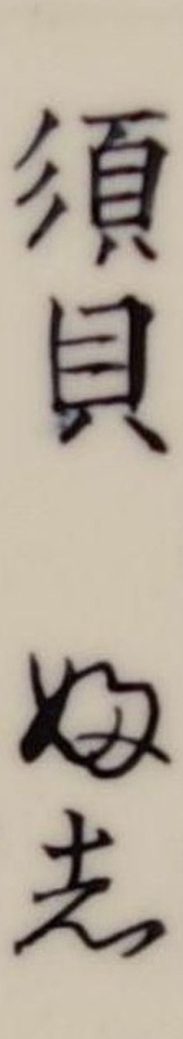須貝ふし
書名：M~S
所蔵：高野山金剛峯寺
